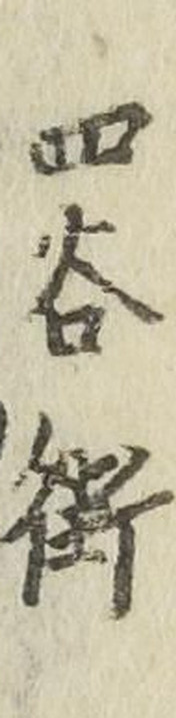四谷街
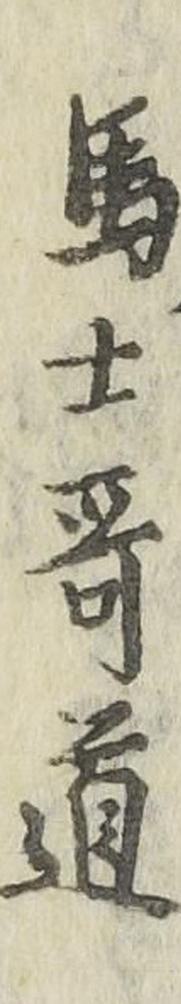馬士哥道

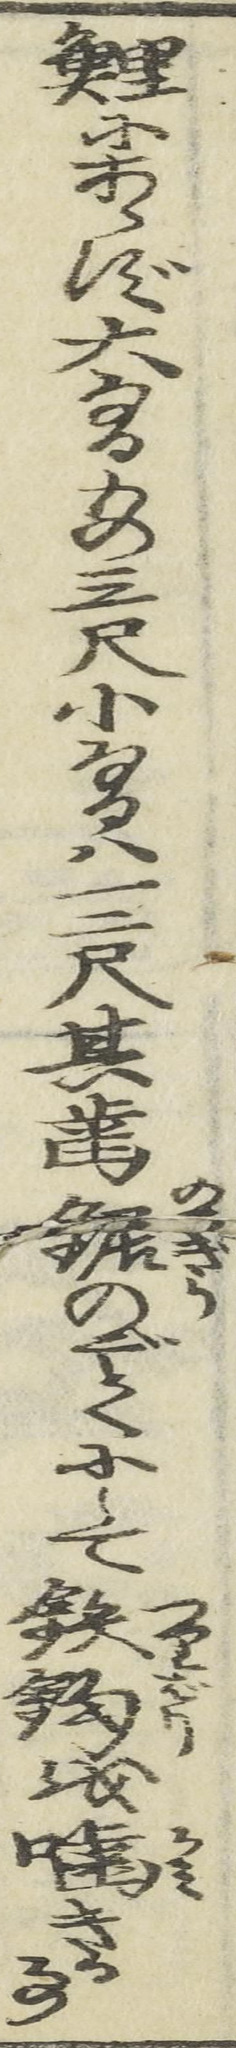鯉にあらず大なるもの三尺小なるは一二尺其歯鋸のごとくにして鉄鈎を噛きる事
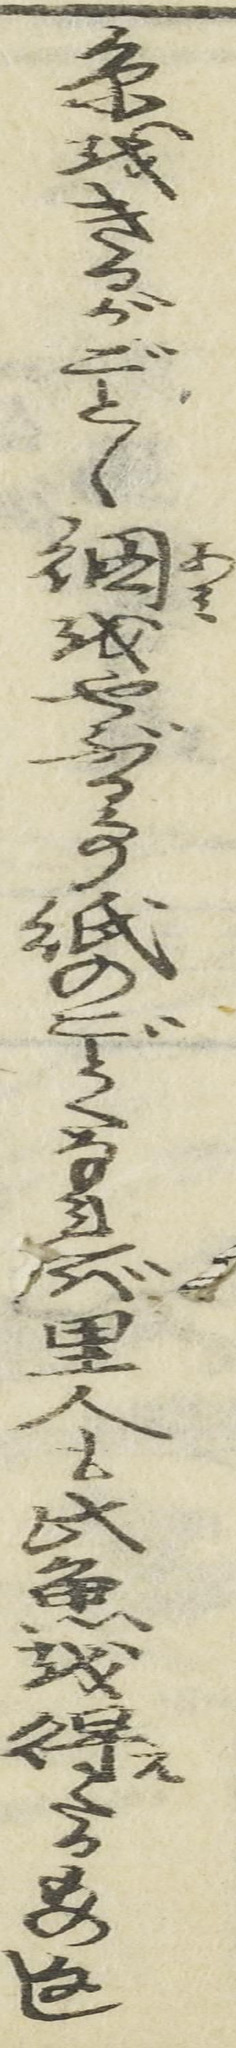糸をきるがごとく網をやぶる事神のごとくなれば里人も此魚を得たるものなし
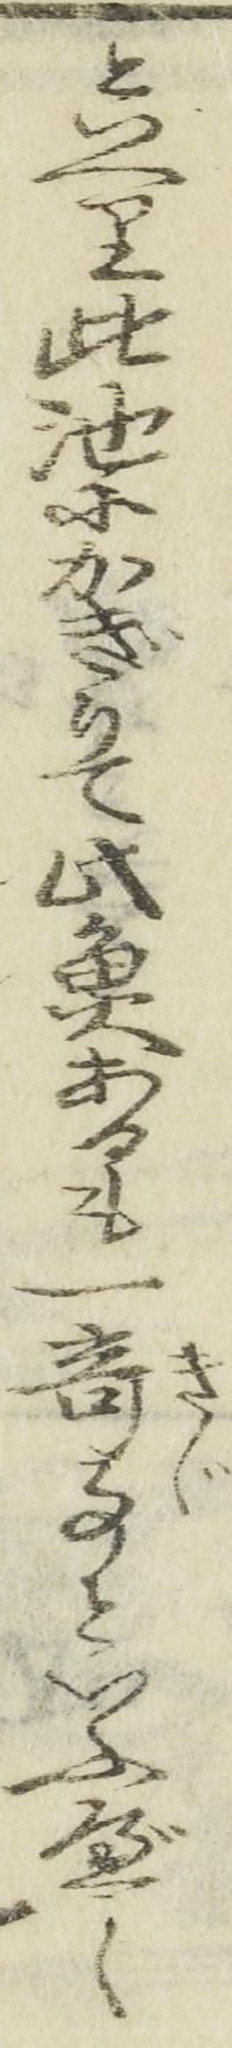といへり此池にかぎりて此魚あるも一奇事といふべし
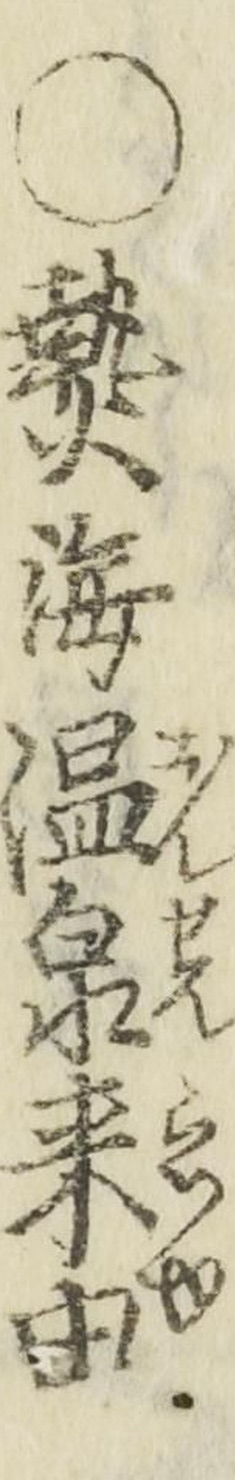○熱海温泉来由
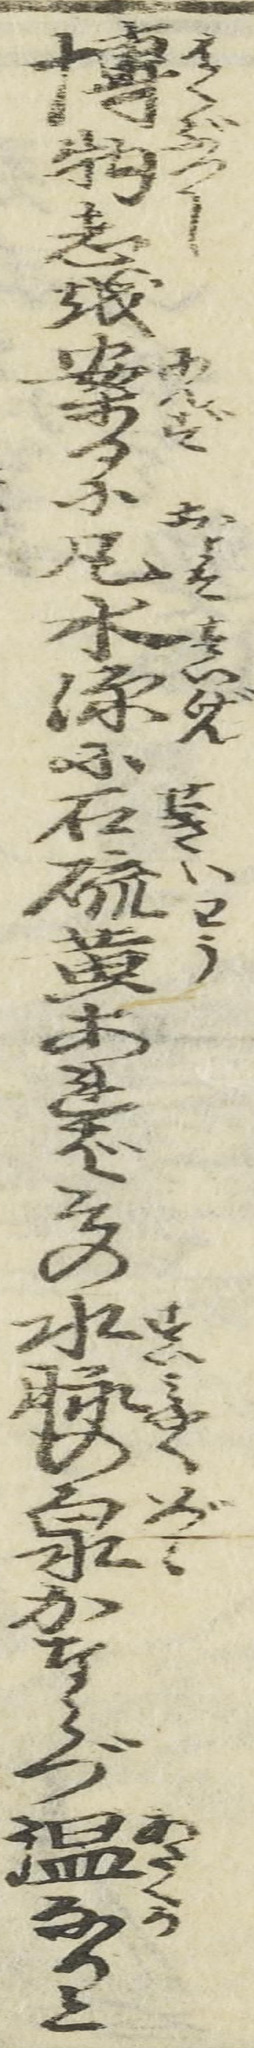博物志を案るに凡水源に石硫黄あればその水脈の泉かならづ温なりと
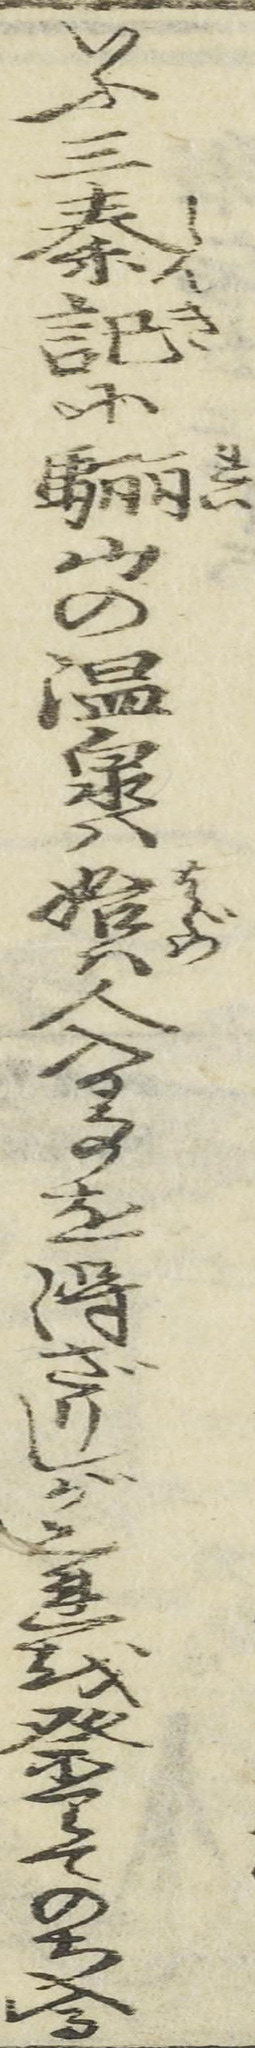いふ三秦記に驪山の温泉は始は人入る事を得ざりしがこれを祭りてのち入る
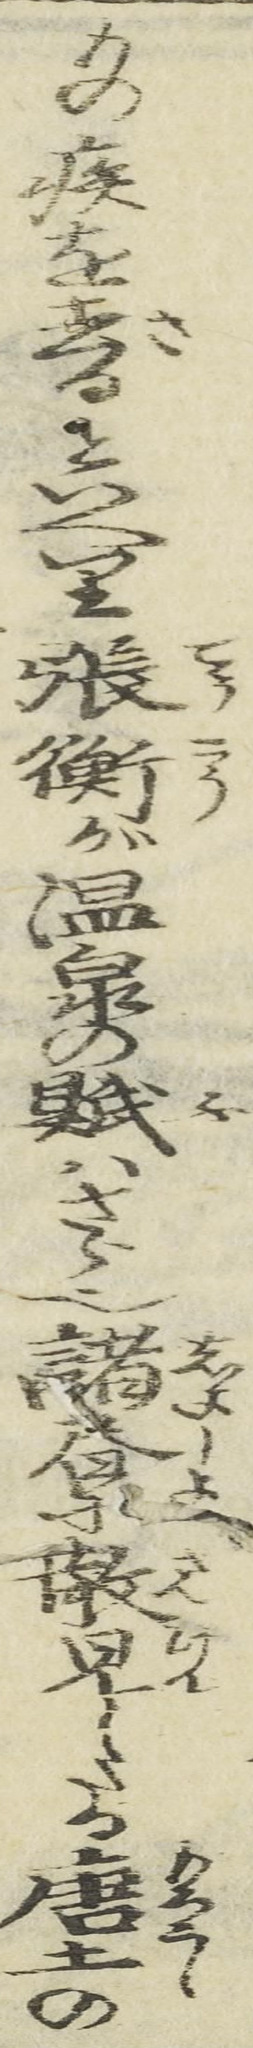もの疾を去るといへり張衡が温泉の賦はさら也諸書に散見したる唐土の
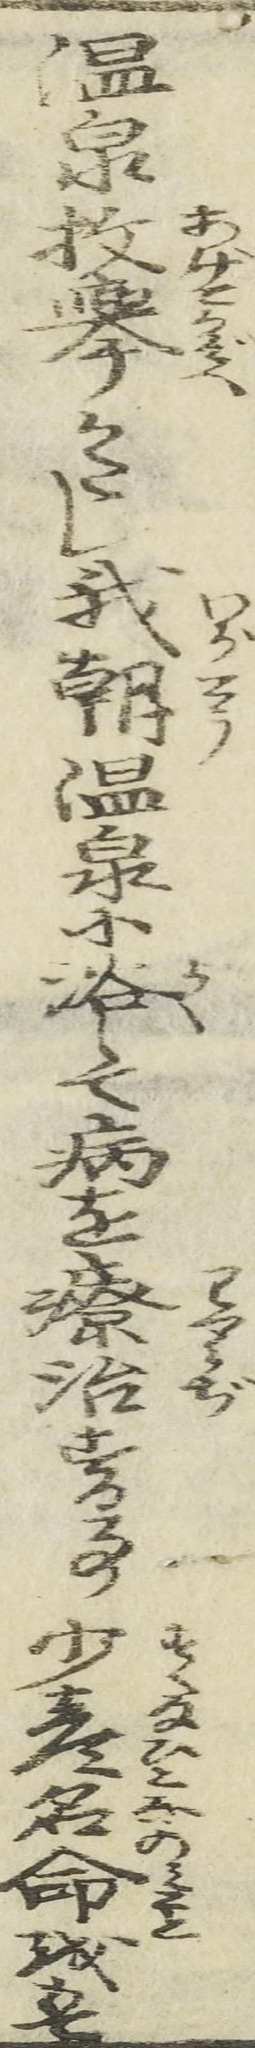温泉枚挙かたし我朝温泉に浴して病を療治する事少彦名命をもて
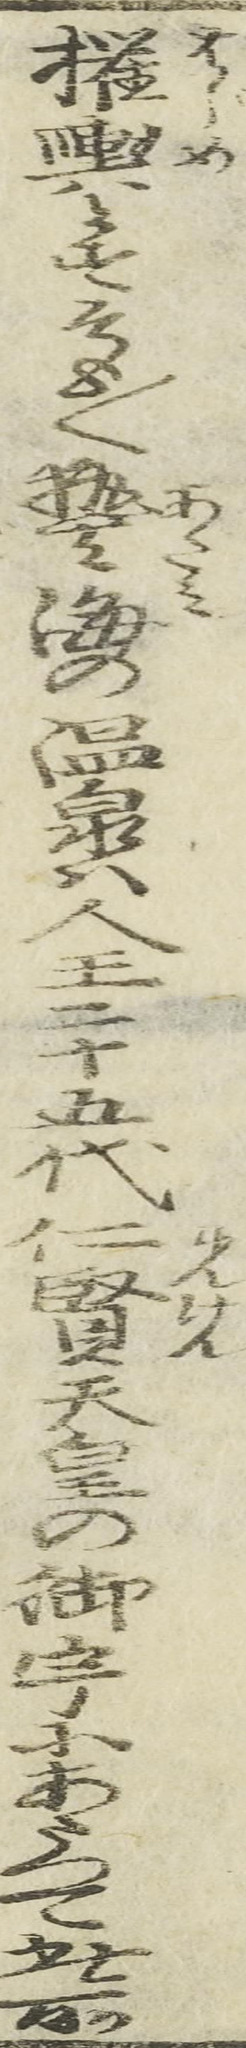権輿とすそも〳〵熱海の温泉は人王二十五代仁賢天皇の御宇にあたつて此所
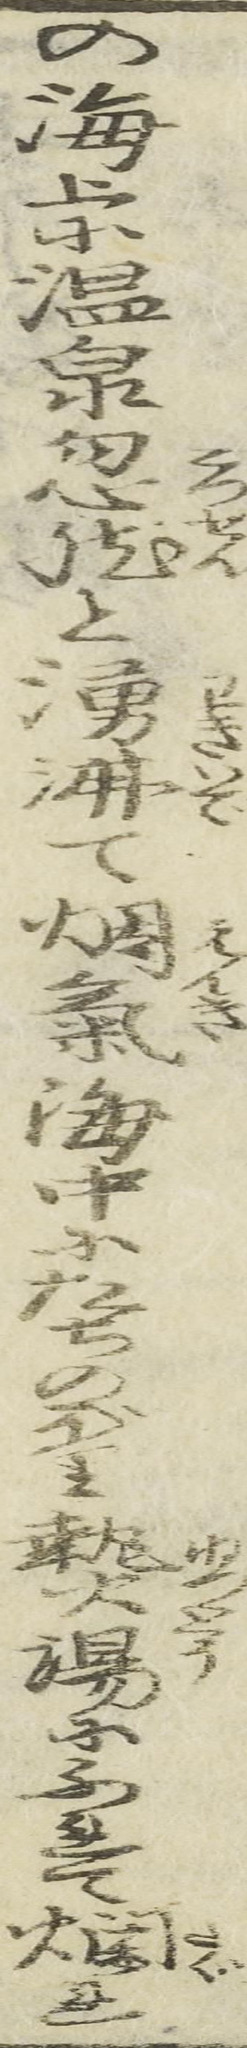の海上に温泉忽然と湧沸て烟気海中にたちのほり熱湯にふれて爛れ
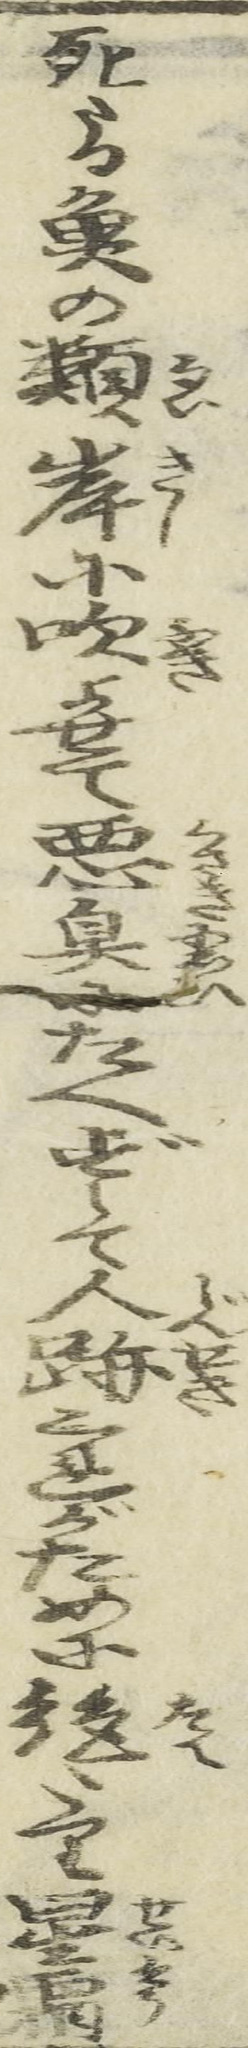死たる魚の類岸に吹よせて悪臭にたへずして人跡これがために絶たり星霜
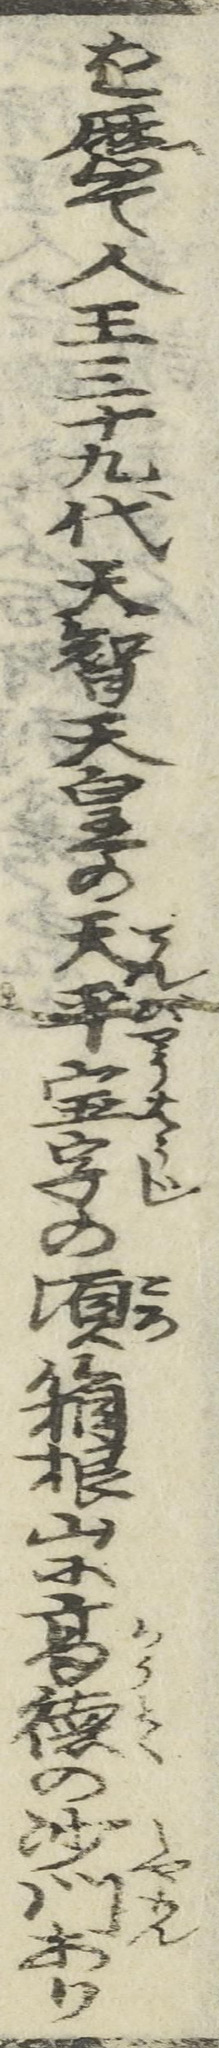を歴て人王三十九代天智天皇の天平宝字の頃箱根山に高徳の沙門あり
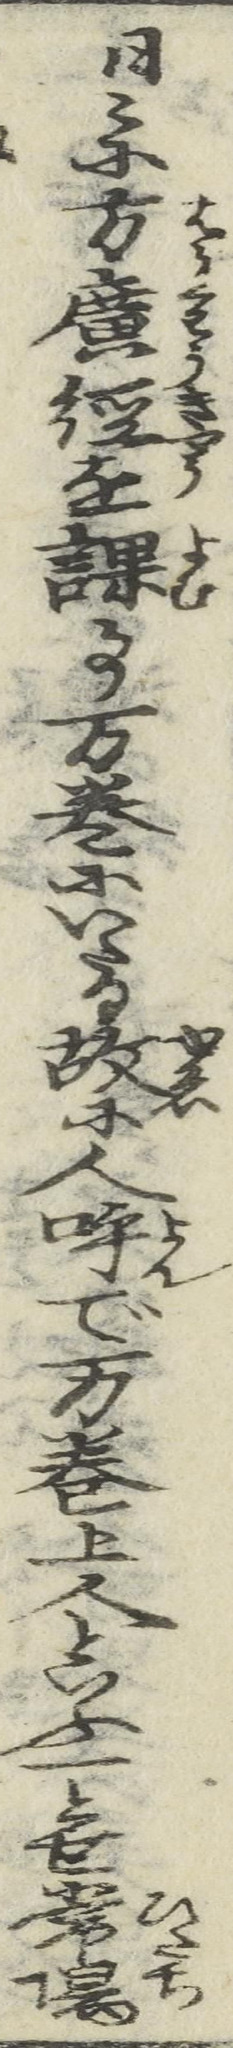月々に方広経を課事万巻にいたる故に人呼で万巻上人といふ一とせ常場
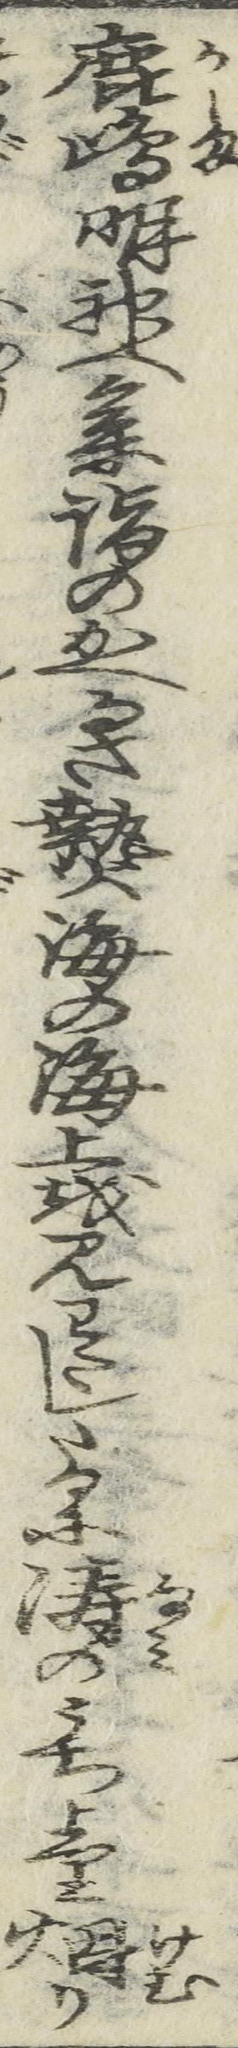鹿嶋明神へ参詣のかへるさ熱海の海上を見わたしたるに涛のうちより烟り
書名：熱海温泉圖彙
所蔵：東京大学地震研究所図書室 Earthquake Research Institute Library, The University of Tokyo, JAPAN
